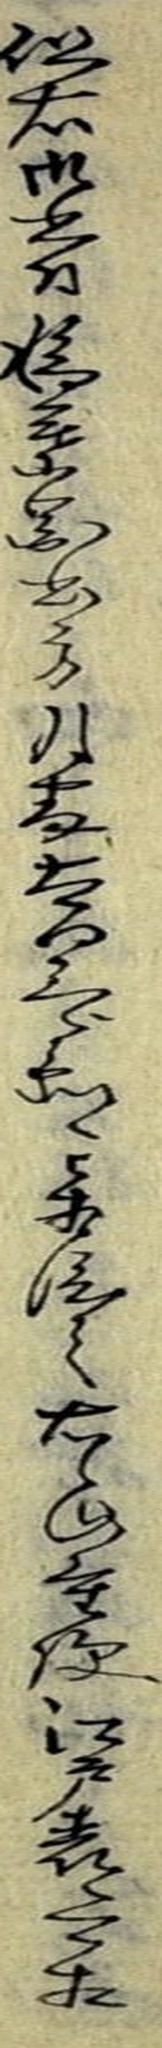但右御書付稻葉図書方月番太田三郎兵衛へ被相渡之右之趣重便江戸表へ可被相
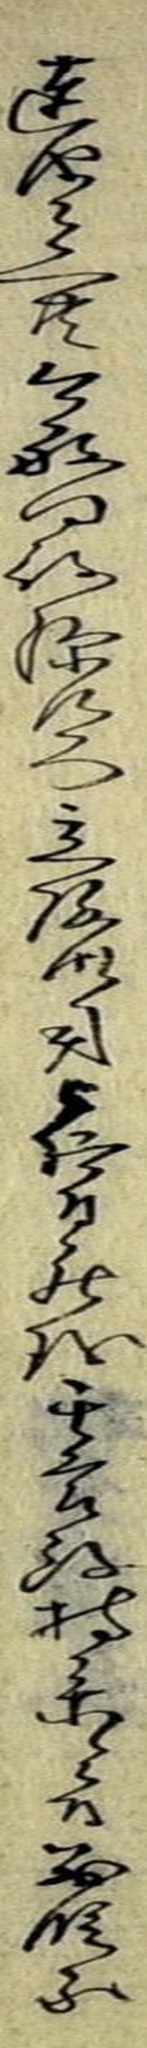達儀に候へ共今般同役源左衛門立帰御用被仰付罷越其節致持参候に付別段不
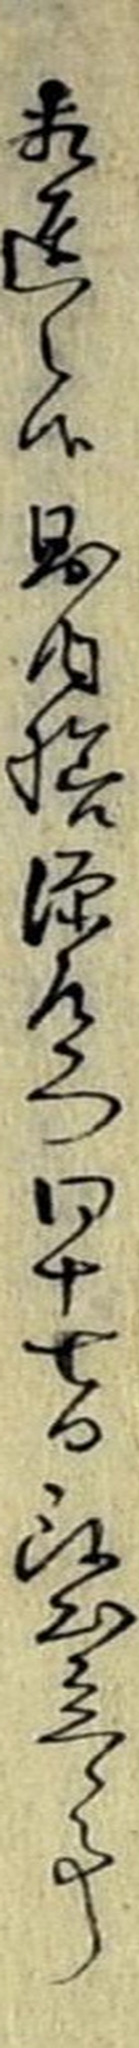相達之候則内膳源左衛門同十七日致出立候事
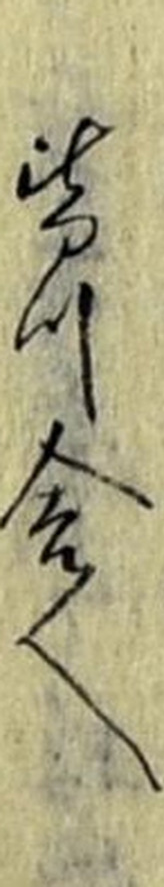皆川舎人
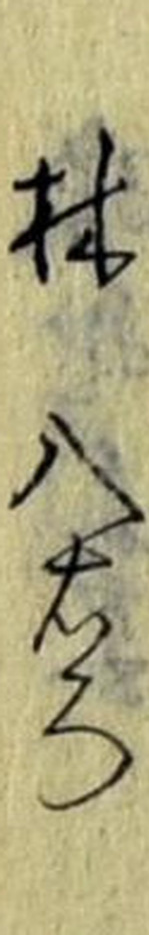林八右衛門

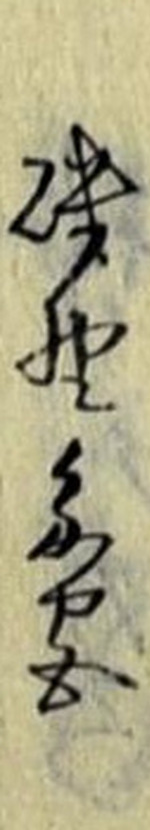磯野多宮
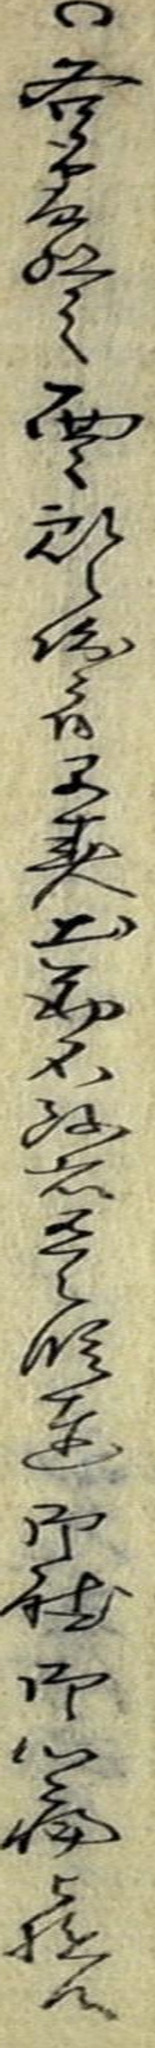○各御番組之面々願之儀に付早春出勤不致者有之段達御聴御心痛被遊候
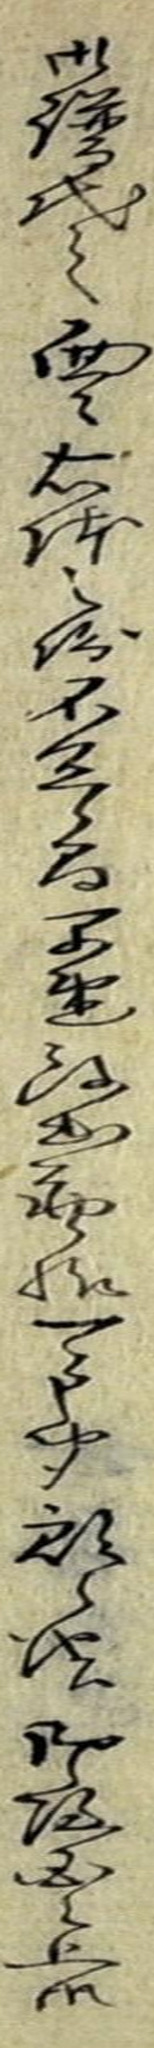御譜代之面々右体之儀不宜候間早速致出勤候様可申聞願之儀は御帰国之上御
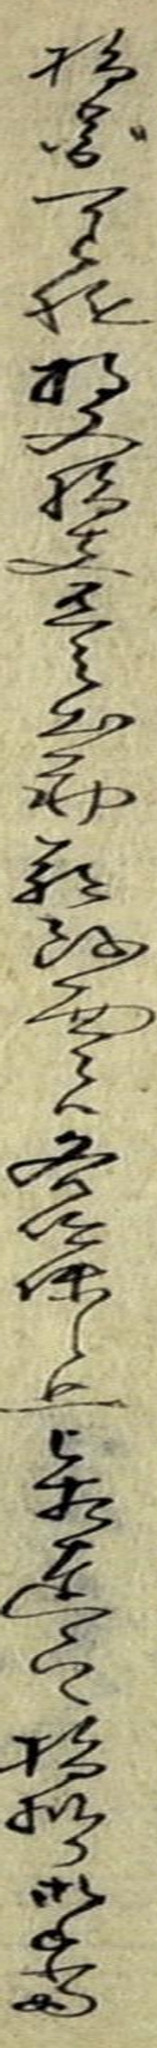指図可被遊将又指支有之出勤難致面々は各吟味之上被相達候はヽ指掛り御手当
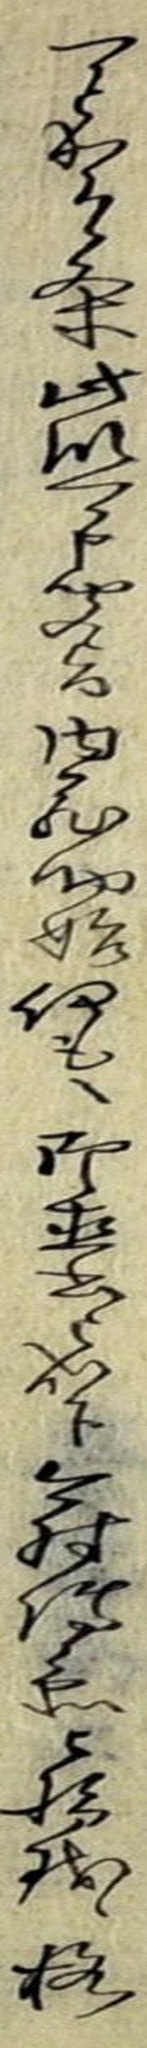可被成下候条此段可申聞旨内蔵助始何もへ御直書被成下今村伝兵衛被指越候格
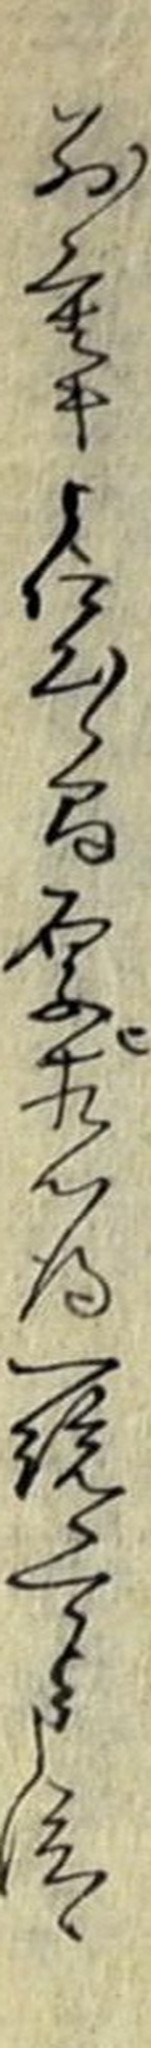別重キ被仰出候間厚被相心得一統へ可被申渡候
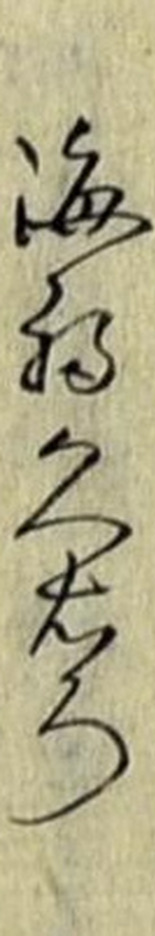海福久右衛門
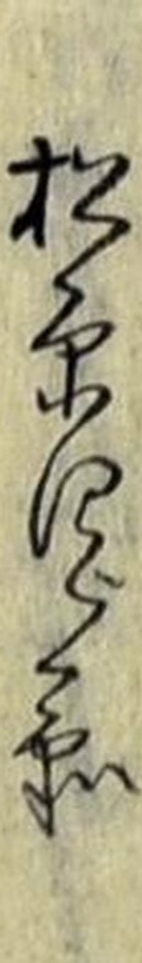松原四郎兵衛
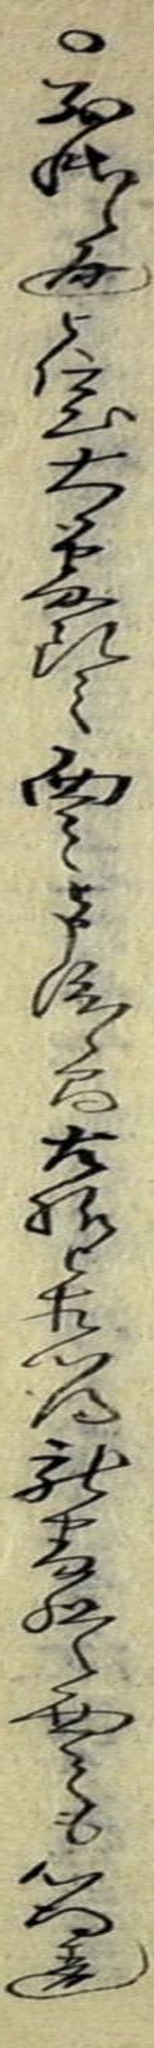○別紙之通被仰出大御番頭之面々へ被申渡候間左様被相心得新番組之面々へも心得違
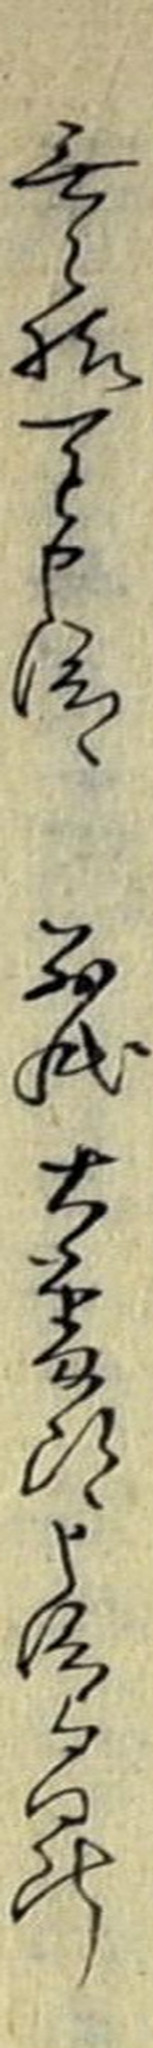無之様可被申渡候別紙大御番頭へ申渡と同断
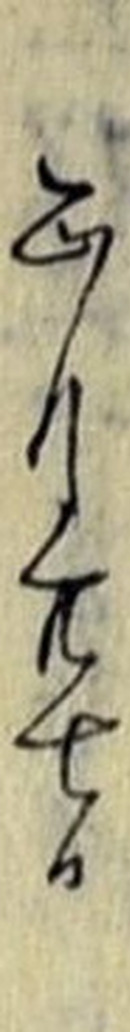正月廿七日
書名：命令之部 四
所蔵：福井県文書館 Fukui Prefectural Archives
